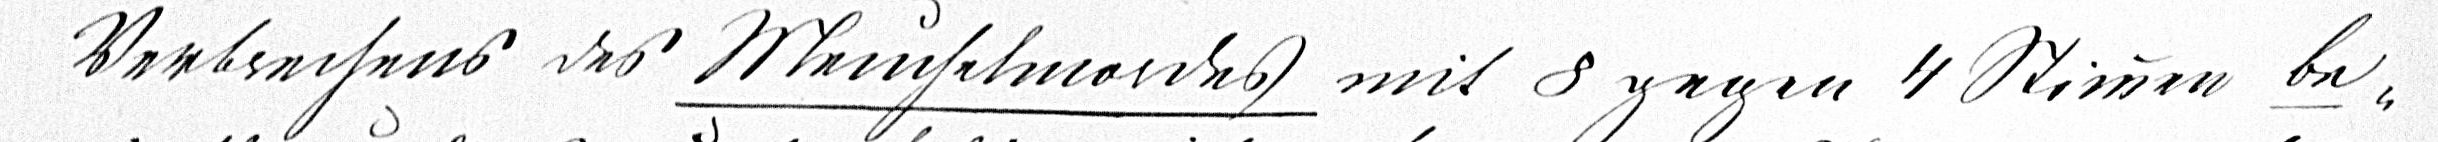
Verbrechens des Meuchelmordes mit 8 gegen 4 Stimmen be¬
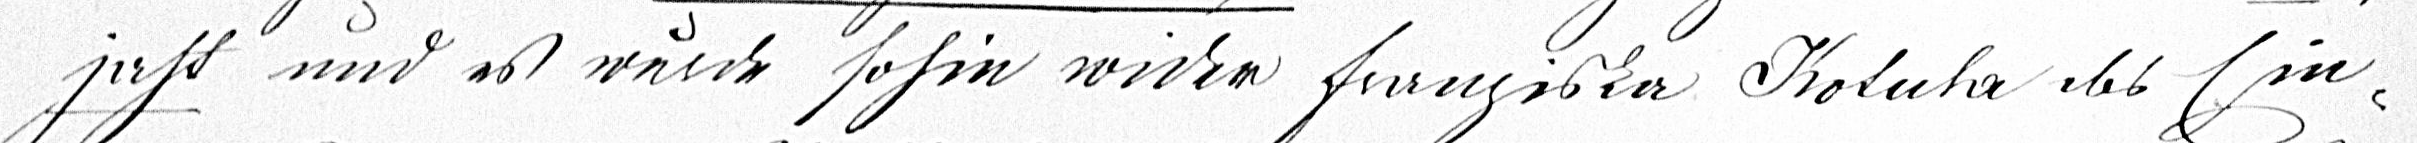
jaht und es wurde sohin wider Franziska Kotula des Ein¬
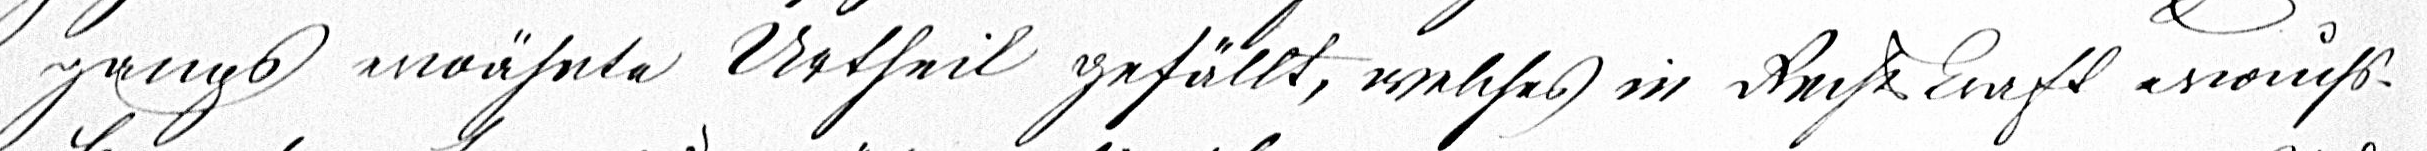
gangs erwähnte Urtheil gefällt, welches in Rechtkraft erwuchs.
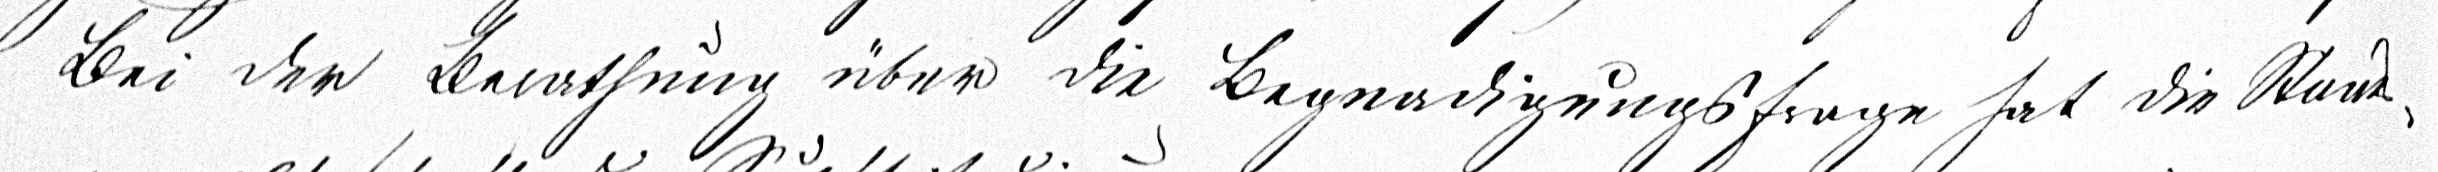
Bei der Berathung über die Begnadigungsfrage hat die Staats
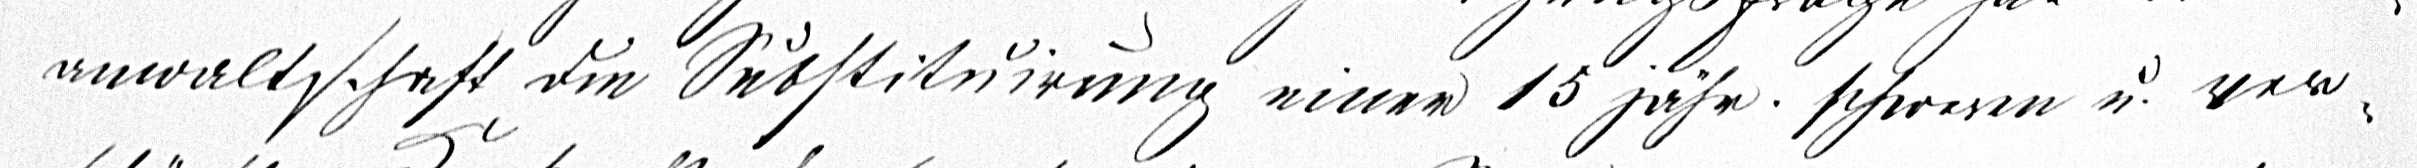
anwaltschaft die Substituirung einer 15 jähr. schweren u. ver¬
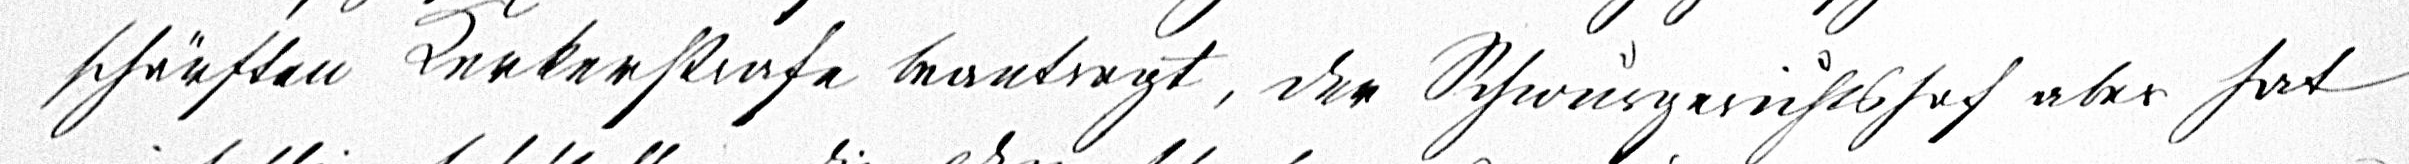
schärften Kerkerstrafe beantragt, der Schwurgerichtshof aber hat
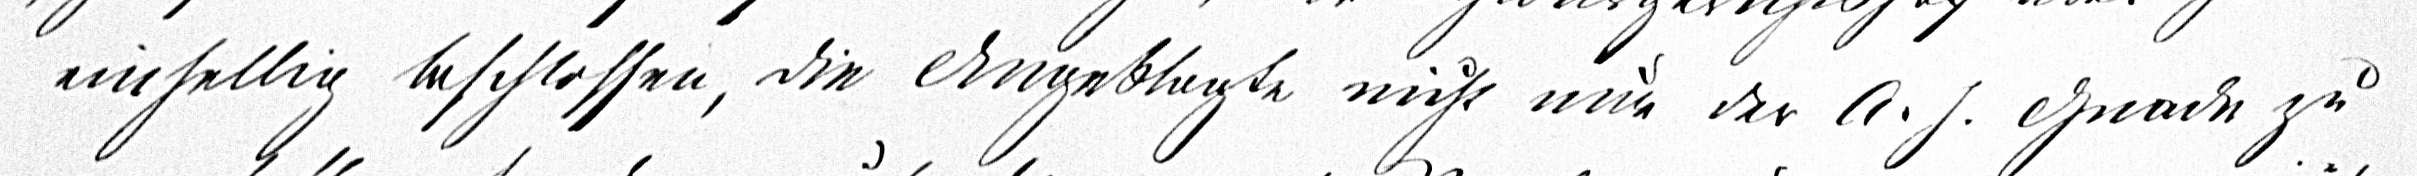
einhellig beschlossen, die Angeklagte nicht nur der A.h. Gnade zu
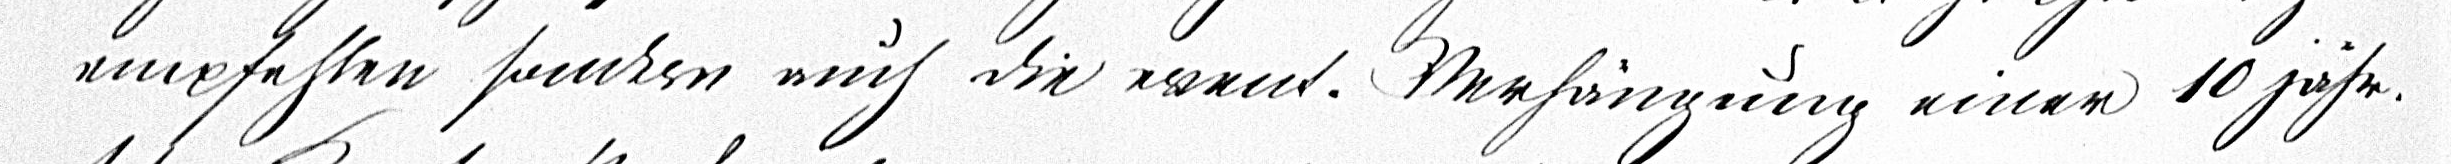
empfehlen sondern auch die event. Verhängung einer 10 jähr.
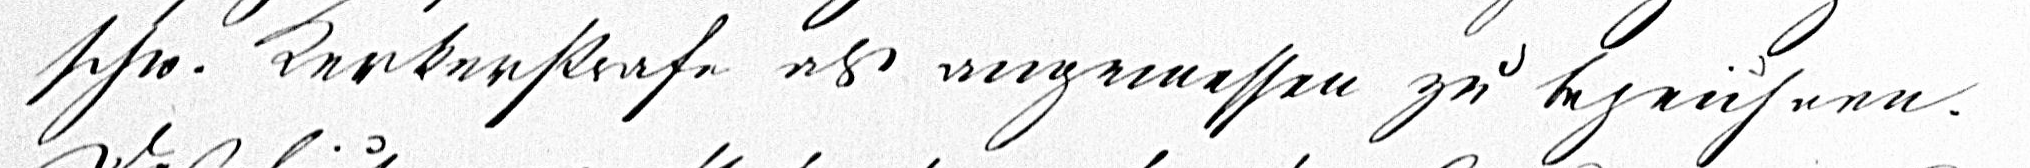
schw. Kerkerstrafe als angemessen zu bezeichnen.
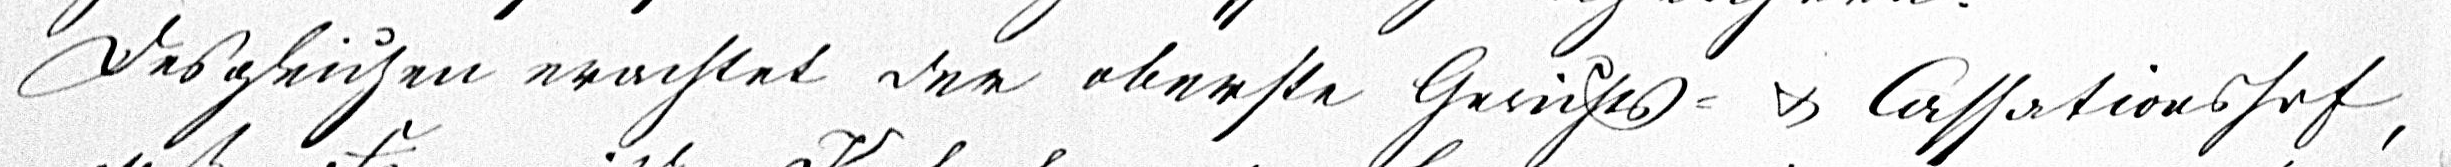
Desgleichen erachtet der oberste Gerichts- &Cassationshof,
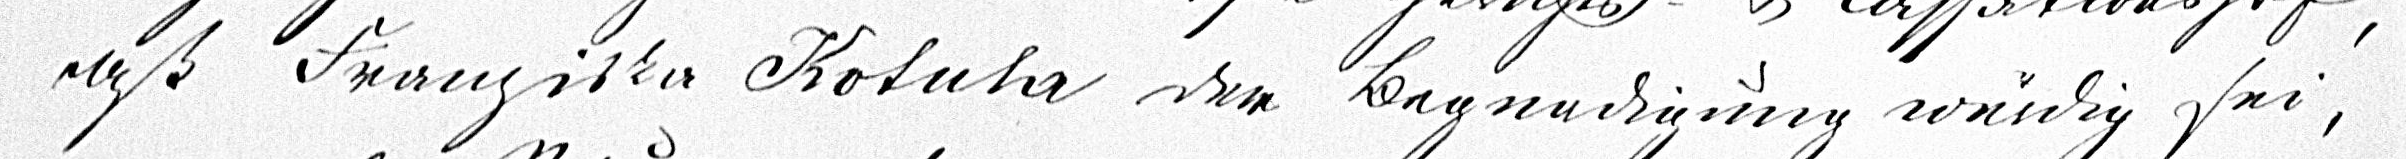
daß Franziska Kotula der Begnadigung würdig sei,
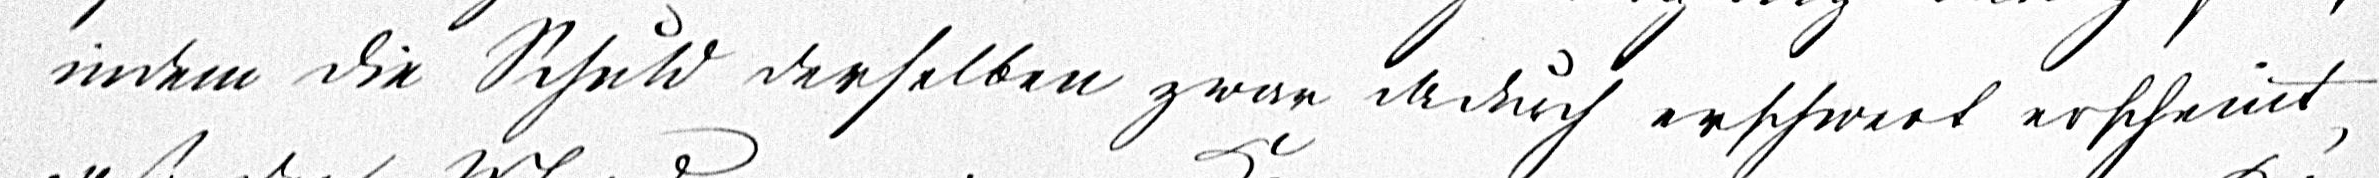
indem die Schuld derselben zwar dadurch erschwert erscheint,
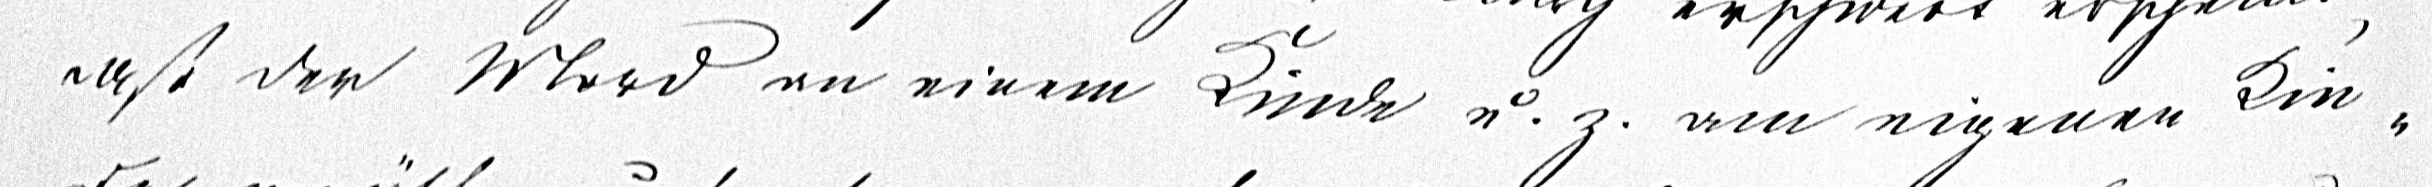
daß der Mord an einem Kinde u.z. am eigenen Kin¬
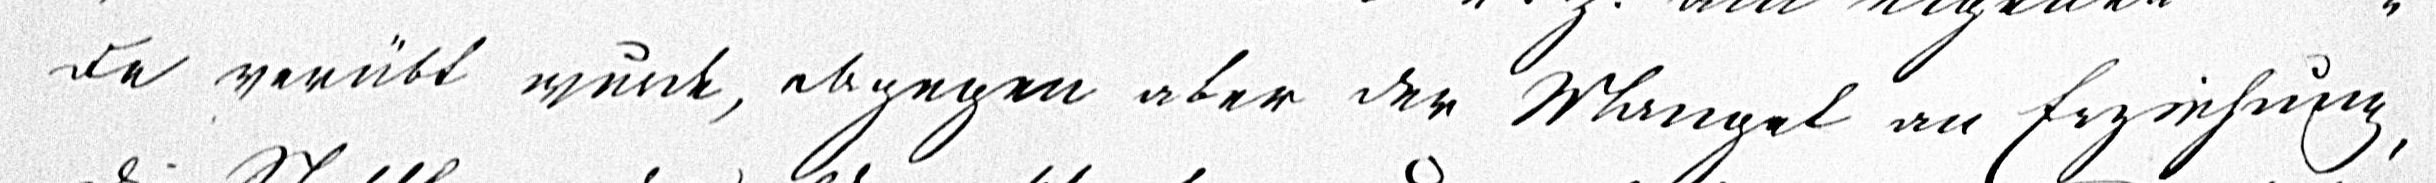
de verübt wurde, dabgegen aber der Mangel an Erziehung,
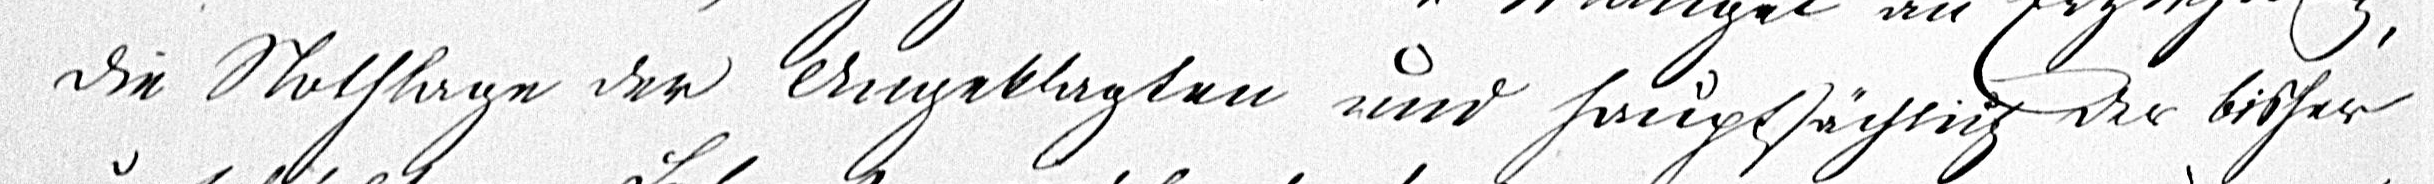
die Nothlage der Angeklagten und hauptsächlich der bisher
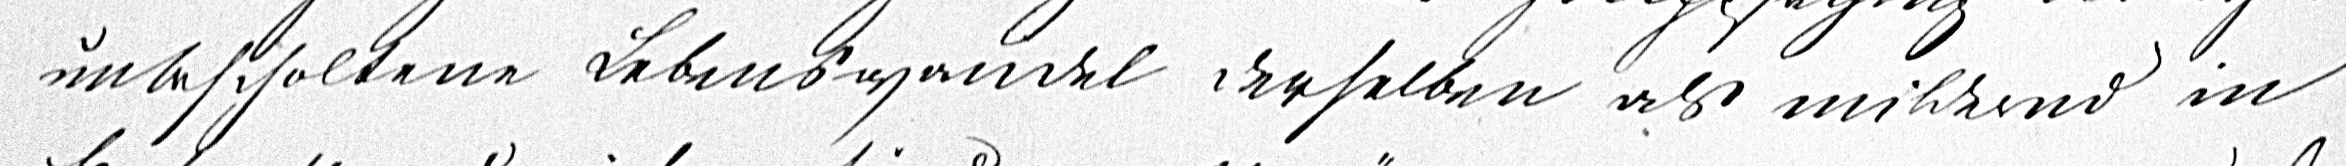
unbescholtene Lebenswandel derselben als mildernd in
